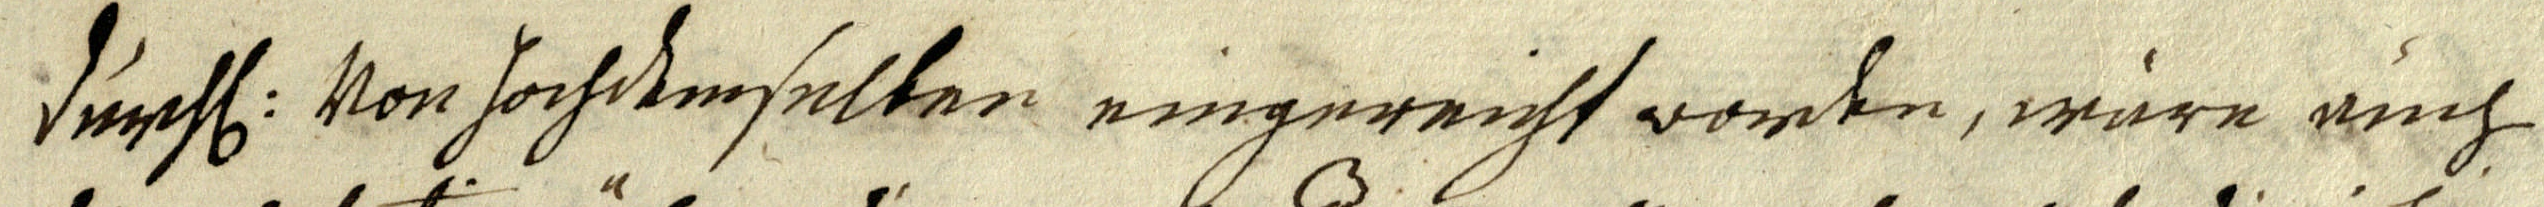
durchl. Von Hochdemselben eingereicht worden, wäre auch
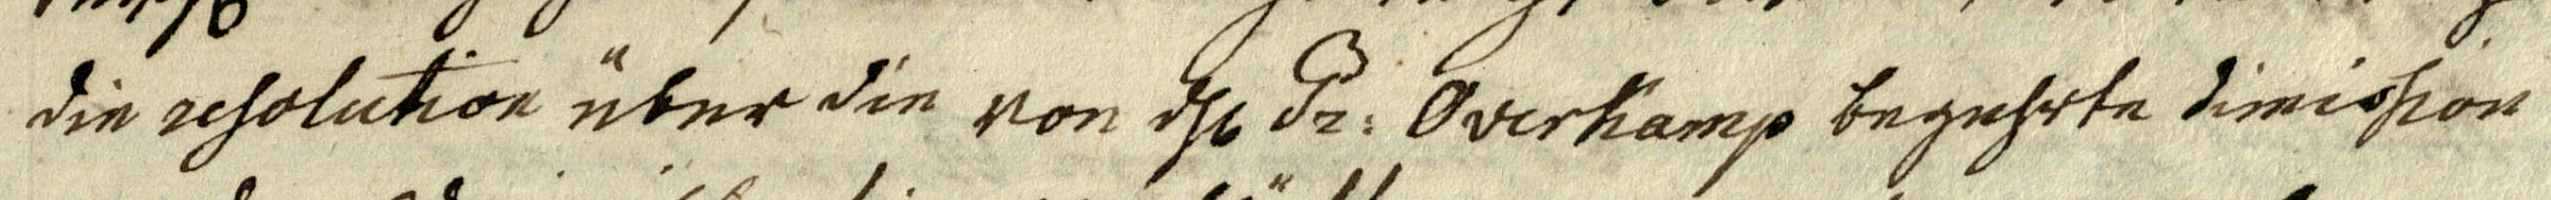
die resolution über die von dh. Pr. Overkamp begehrte dimission
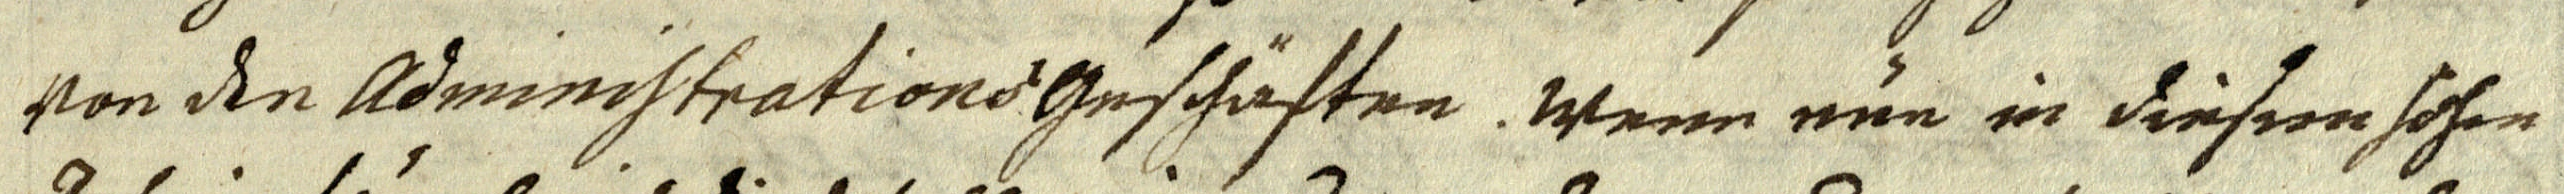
von den Administrations Geschäften. Wenn nun in diesem hohen
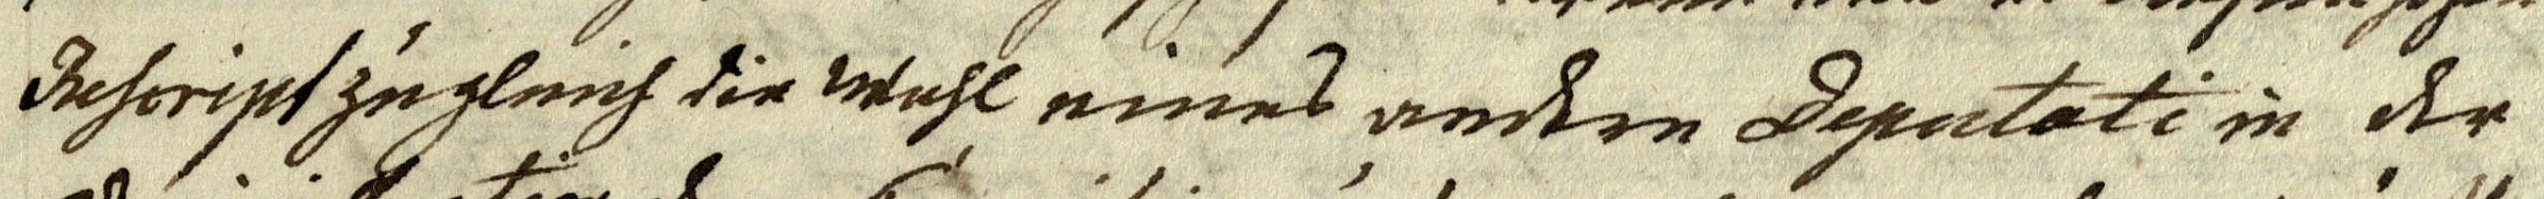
Rescript zugleich die Wahl eines andern Deputati in der
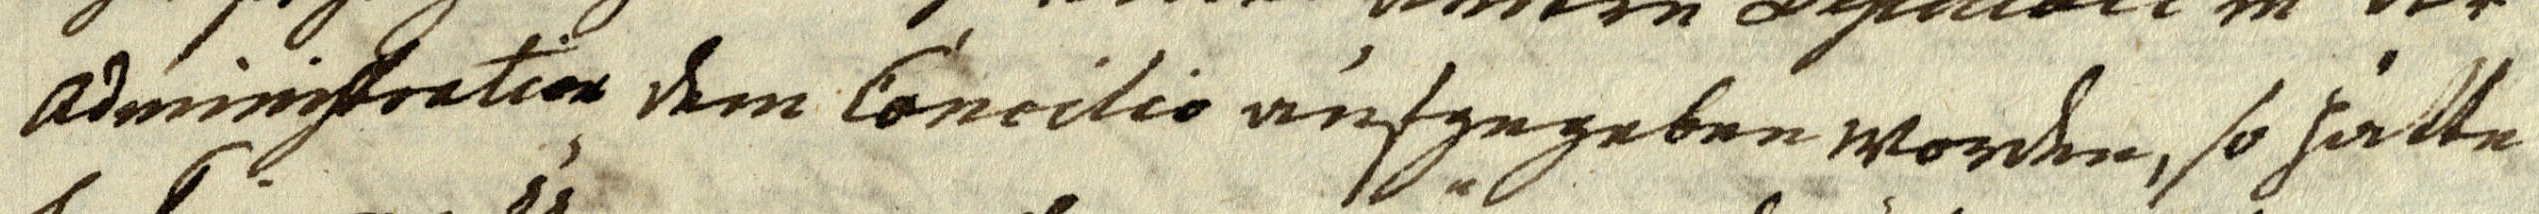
Administration dem Concilio aufgegeben worden, so hätte
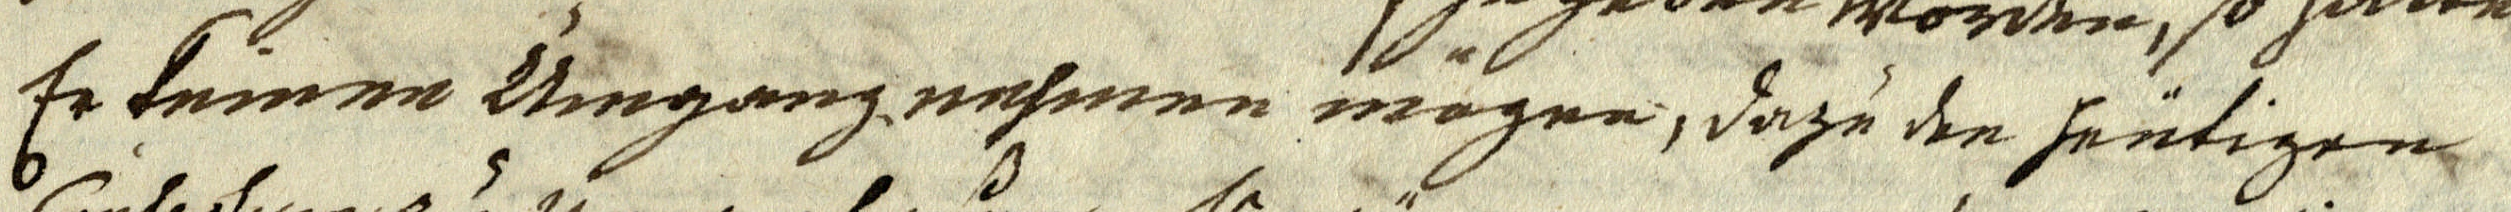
Er keinen Umgang nehmen mögen, dazu den heutigen
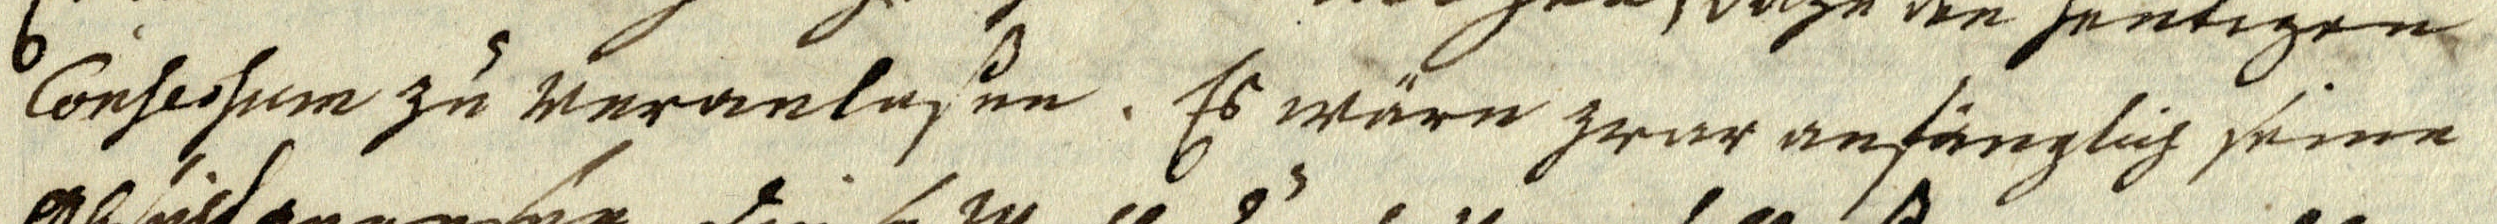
Consessum zu veranlaßen. Es wäre zwar anfänglich seine
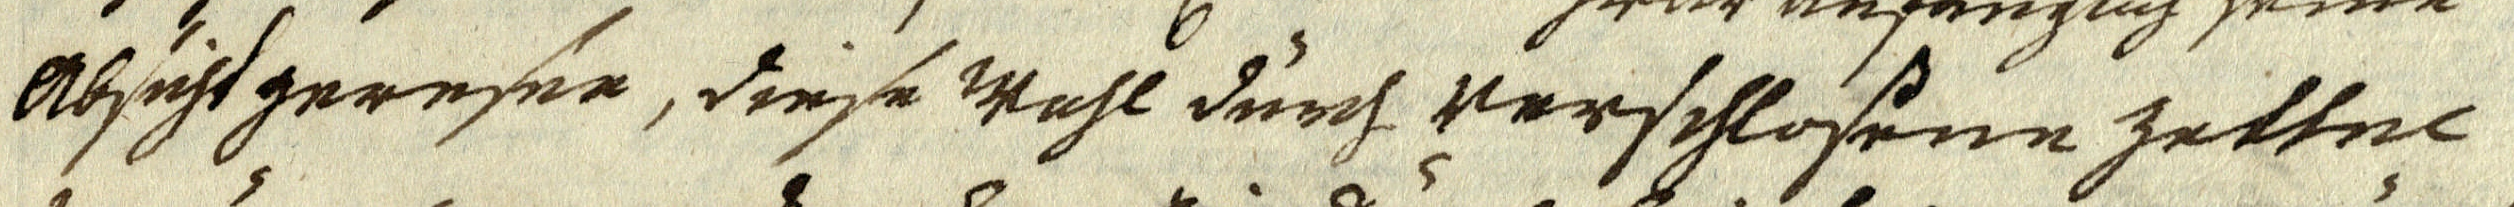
Absicht gewesen, diese Wahl durch verschloßene Zettel
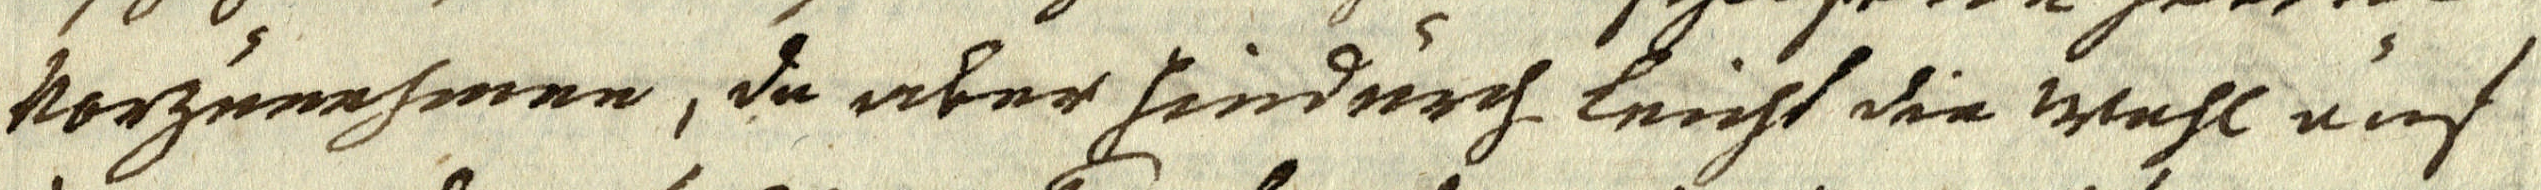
vorzunehmen, da aber hiedurch leicht die Wahl auf
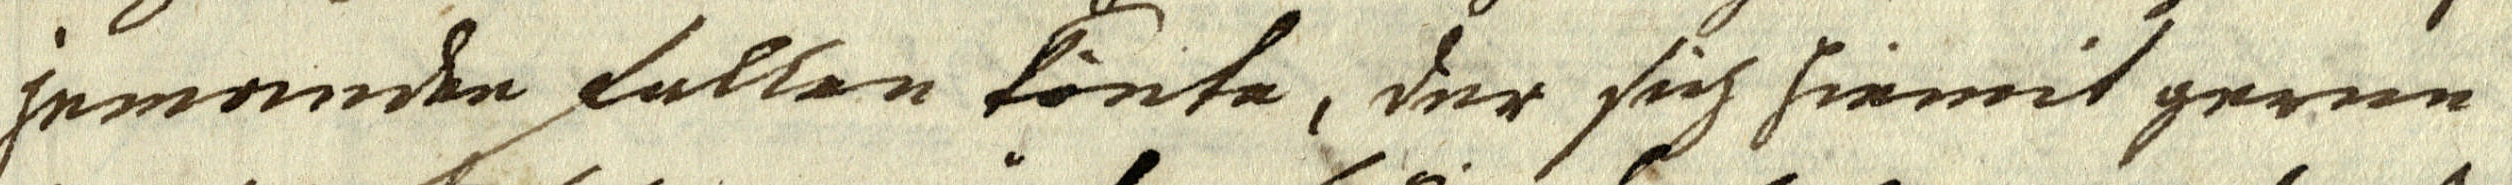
jemanden fallen könte, der sich hiemit gerne
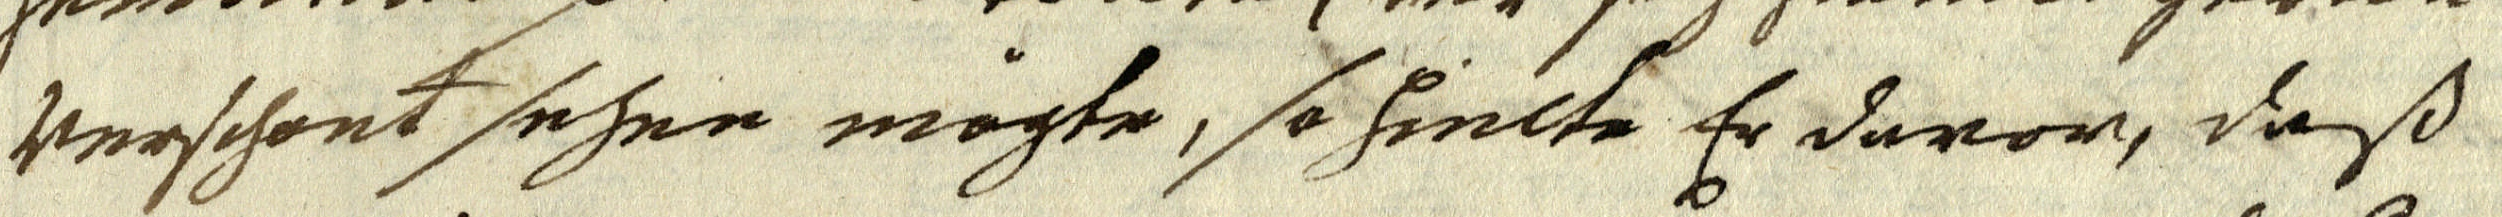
verschont sehen mögte, so hielte Er davor, daß
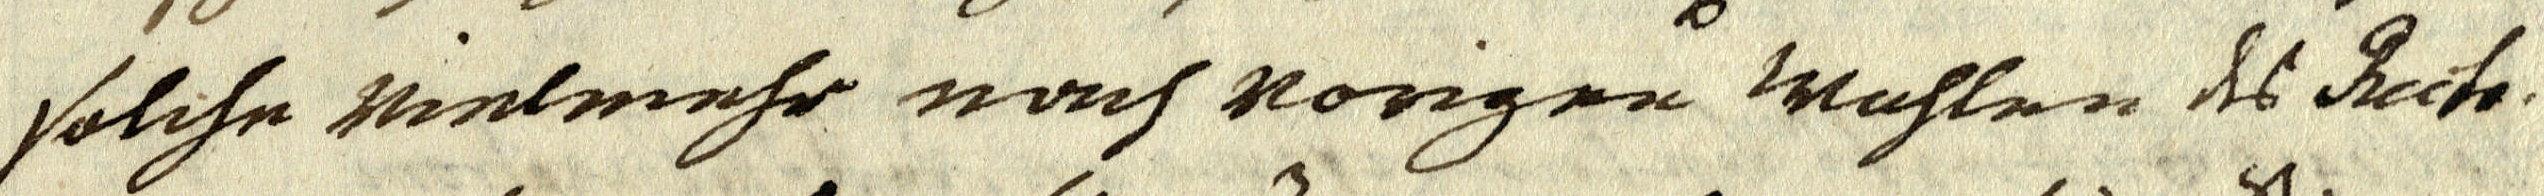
solche vielmehr nach vorigen Wahlen des Recto¬
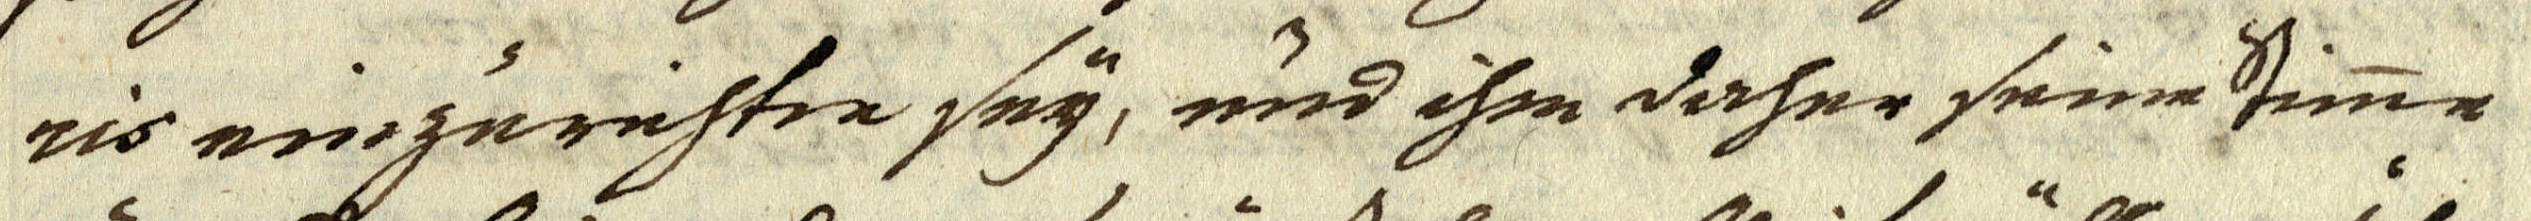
ris einzurichten seÿ, und ihm daher seine Stime
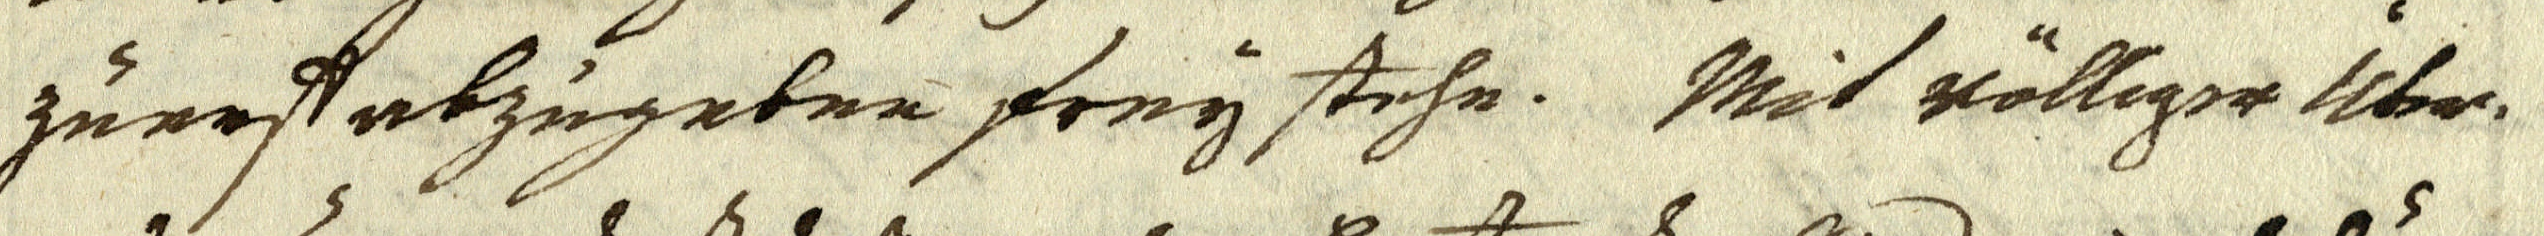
zuerst abzugeben freÿ stehe. Mit völliger Über¬
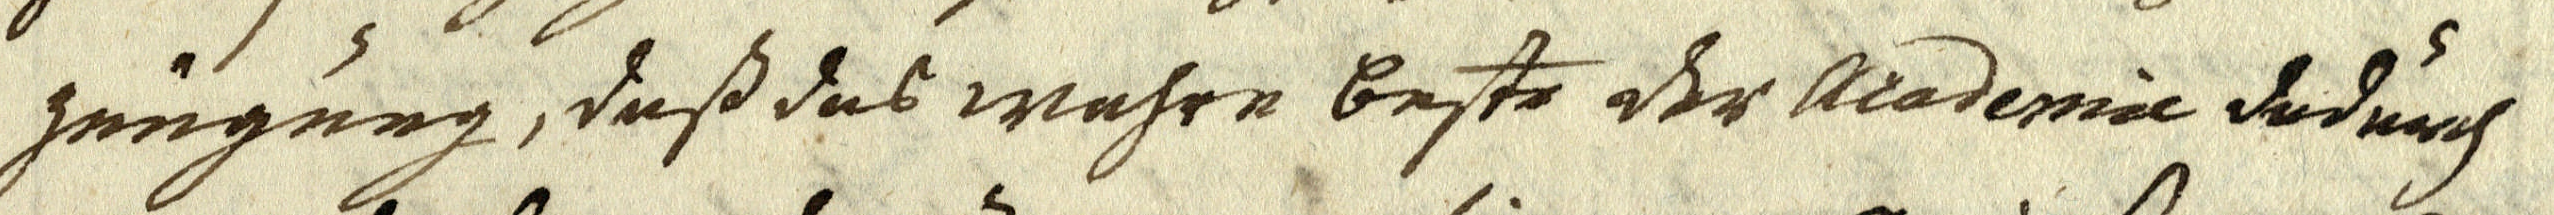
zeugung, daß das wahre beste der Academie dadurch
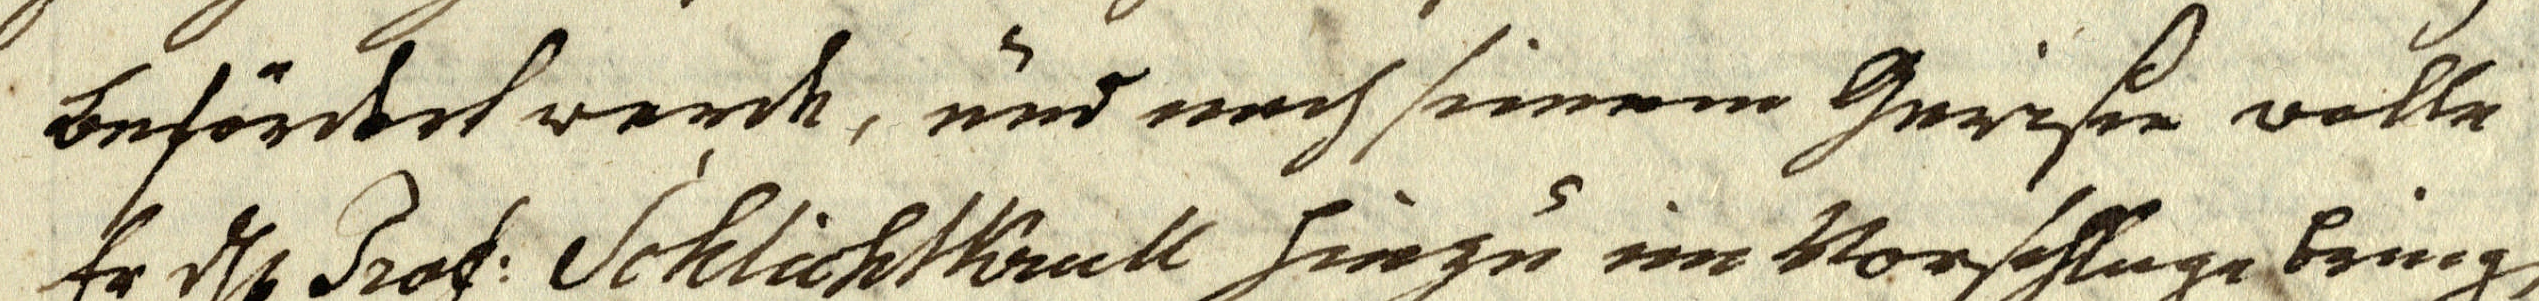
befördert werde, und nach seinem Gewißen wolle
